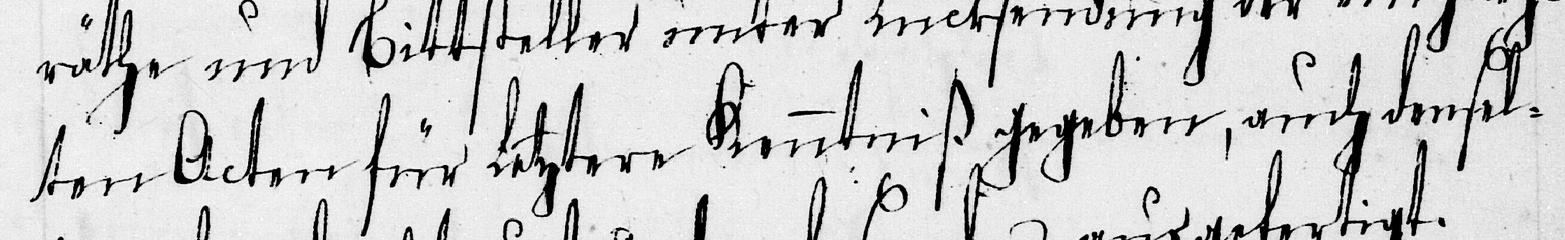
ten Acten für Letztere Kenntniß gegeben, auch densel¬
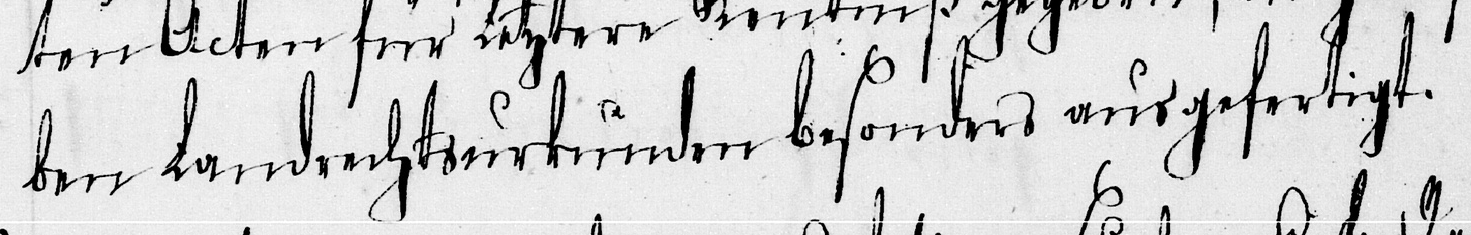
ben Landrechtsurkunden besonders ausgefertigt.
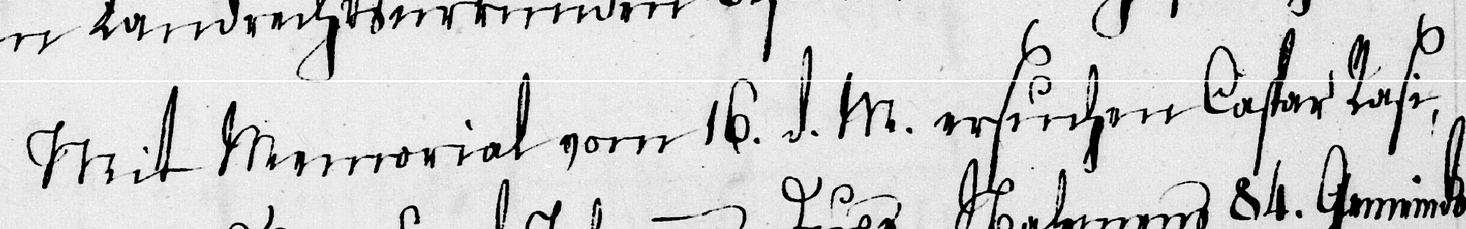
Mit Memorial vom 16. d. M. ersuchen Caspar Rasi,
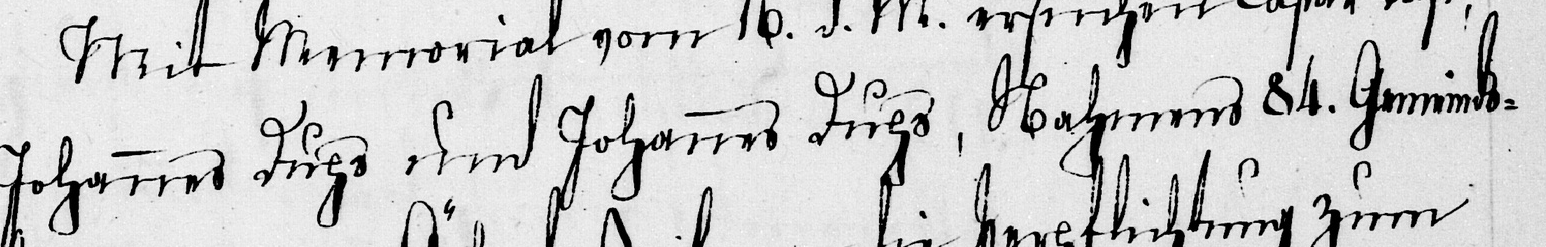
Johannes Dups und Johannes Dups, Nahmens 84. Gemeinds¬
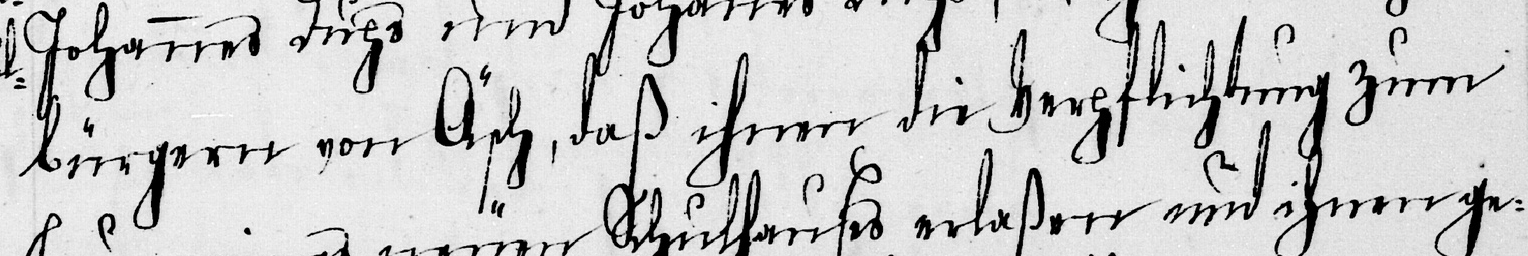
bürgern von Äsch, daß ihnen die Verpflichtung zum
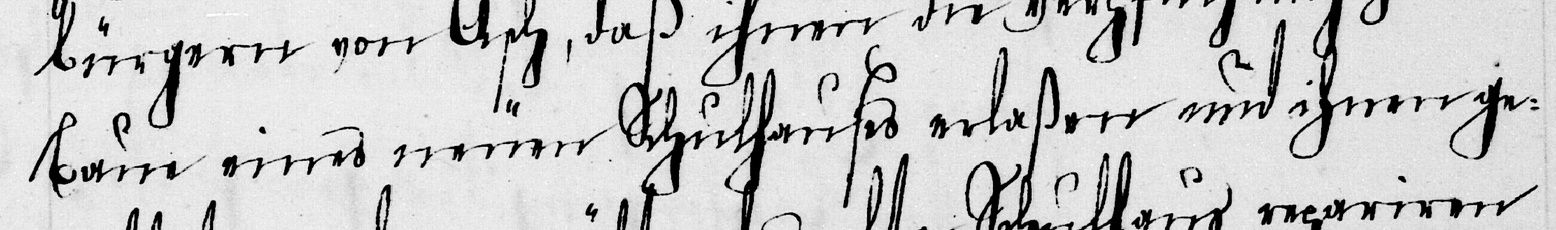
Baue eines neuen Schulhauses erlaßen und ihnen ge¬
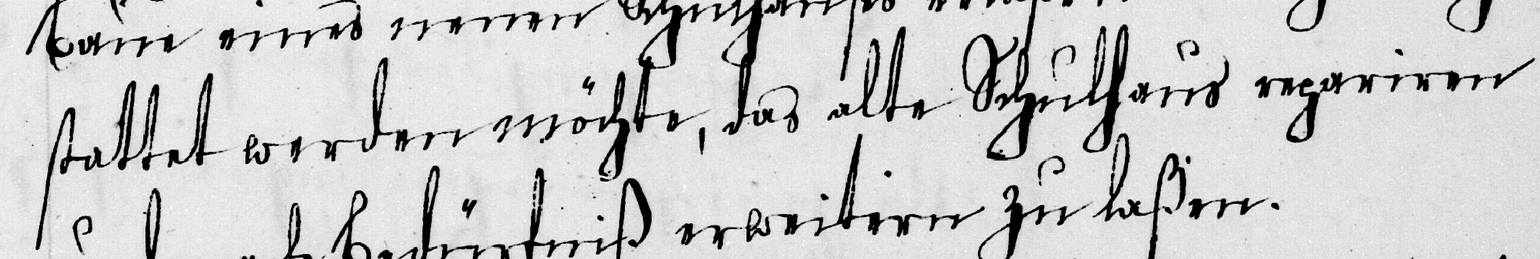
stattet werden möchte, das alte Schulhaus repariren
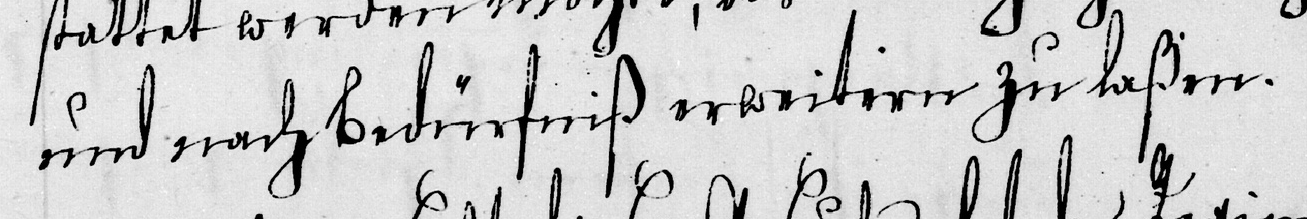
und nach Bedürfniß erweitern zu laßen.
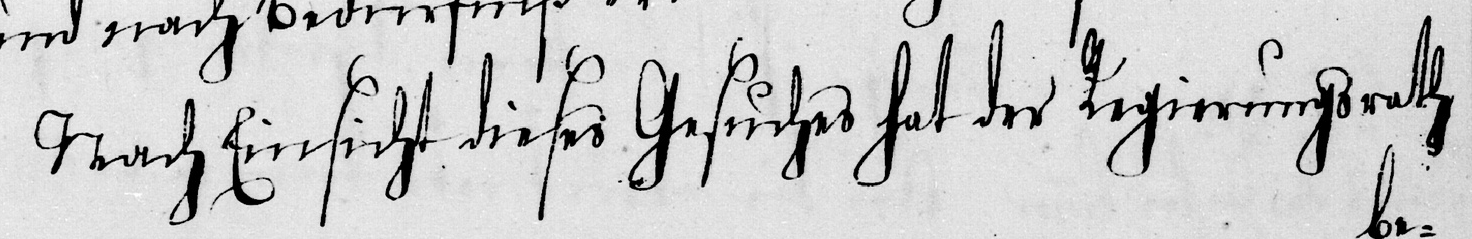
Nach Einsicht dieses Gesuches hat der Regierungsrath
